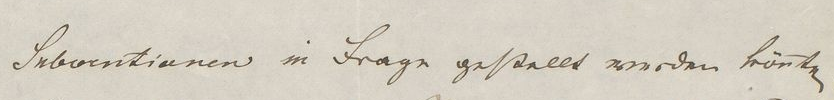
Subventionen in Frage gestellt werden könnten.
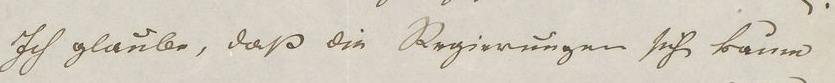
Ich glaube, daß die Regierungen sich kaum
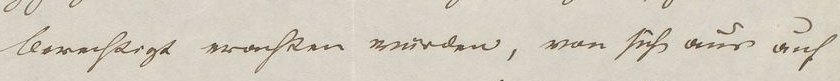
berechtigt wachten würden, von sich aus auf
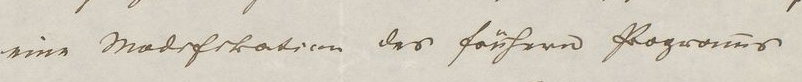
eine Modifikation des frühern Programms
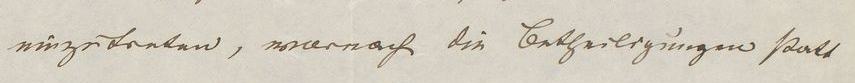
einzutreten, wornach die Betheiligungen statt
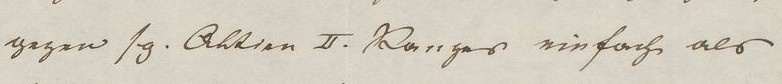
gegen sg. Aktien II. Ranges einfach als
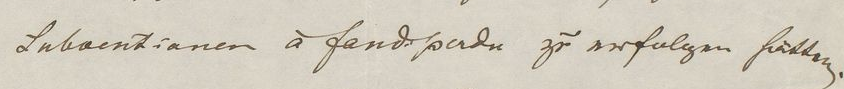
Subventionen à fond perdu zu erfolgen hätten. –
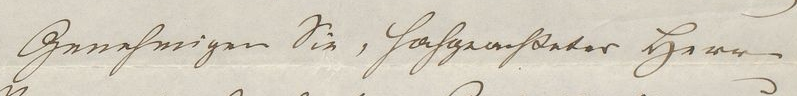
Genehmigen Sie, hochgeachteter Herr
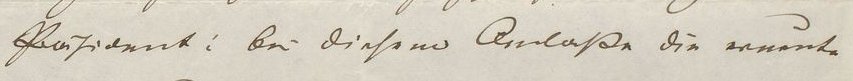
Präsident! bei diesem Anlaße die erneute
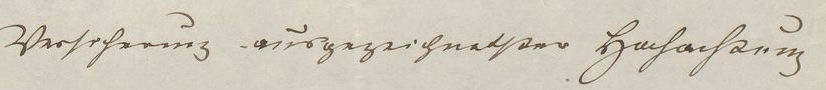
Versicherung ausgezeichnetster Hochachtung
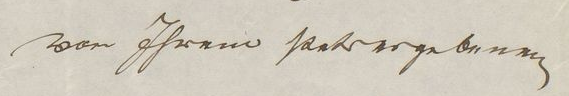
von Ihrem stets ergebenen
